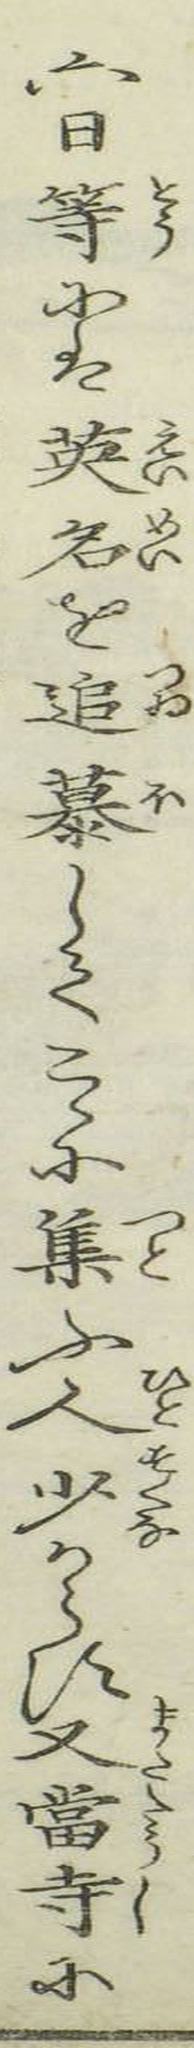六日等には英名を追慕してこゝに集ふ人少からす又當寺に
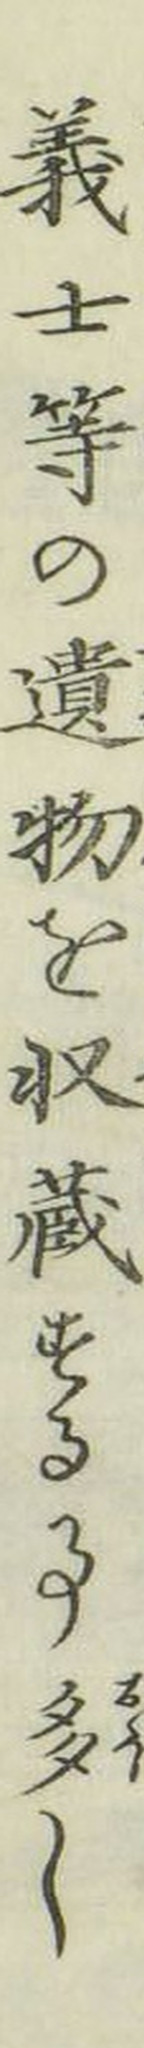義士等の遺物を収蔵する事多し

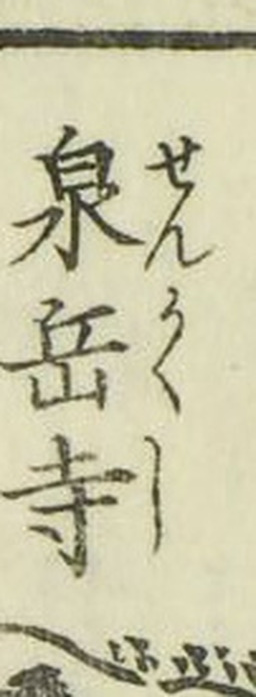泉岳寺
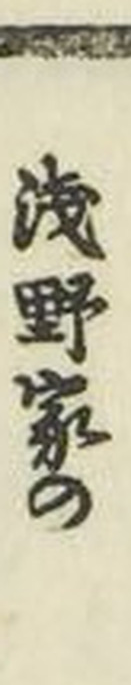浅野家の
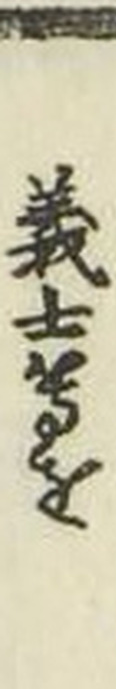義士等を
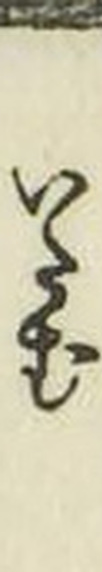いたむ
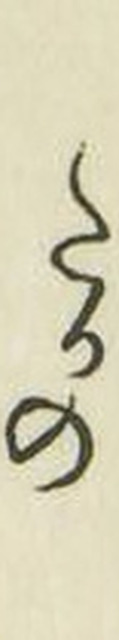たかの
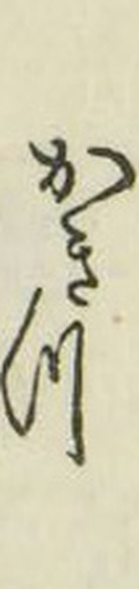かきつ

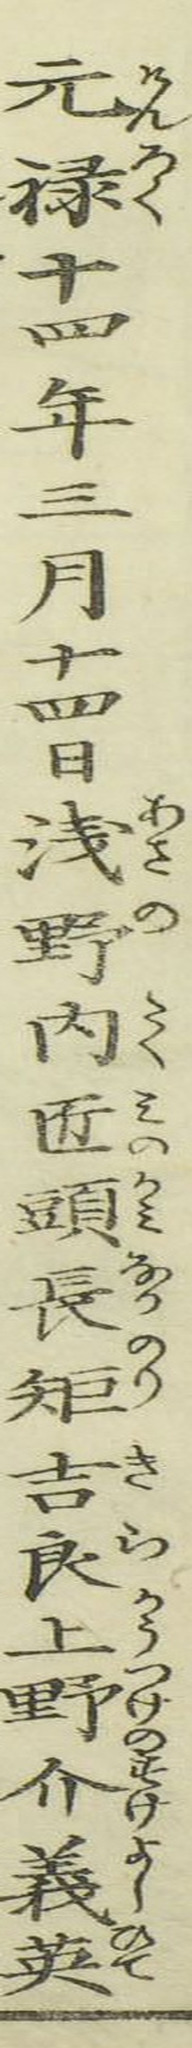元禄十四年三月十四日浅野内匠頭長矩吉良上野介義英
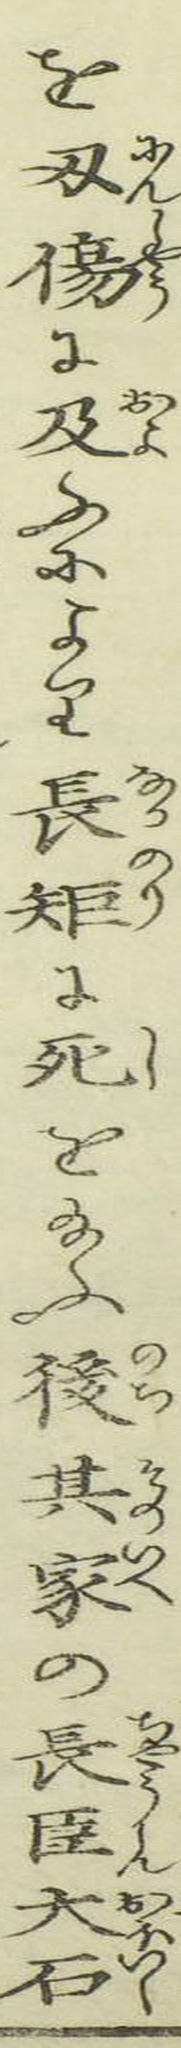を刃傷に及ふにより長矩に死を給ふ後其家の長臣大石
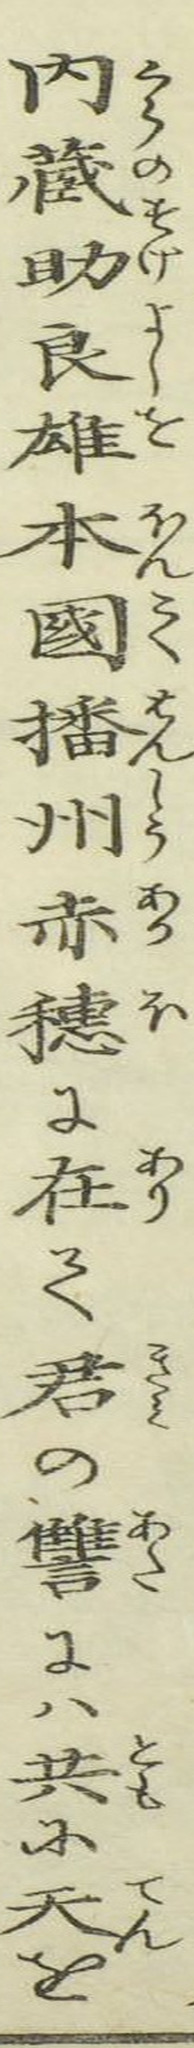内蔵助良雄本國播州赤穂に在て君の讐には共に天を
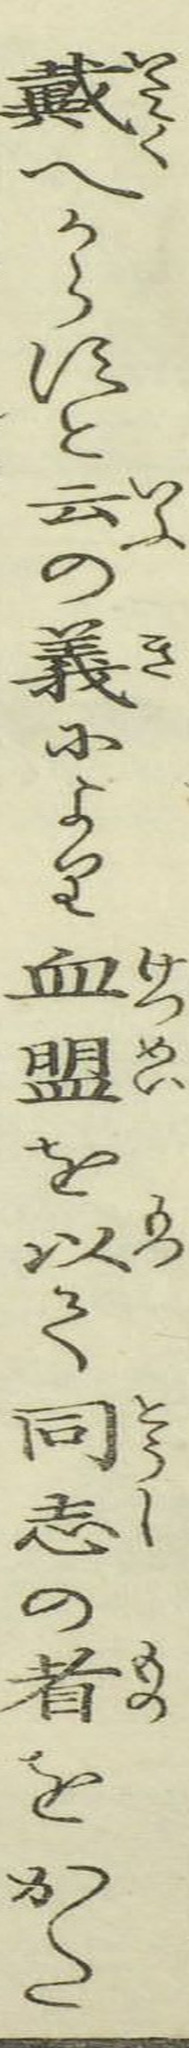戴へからすと云の義により血盟を以て同志の者をかた
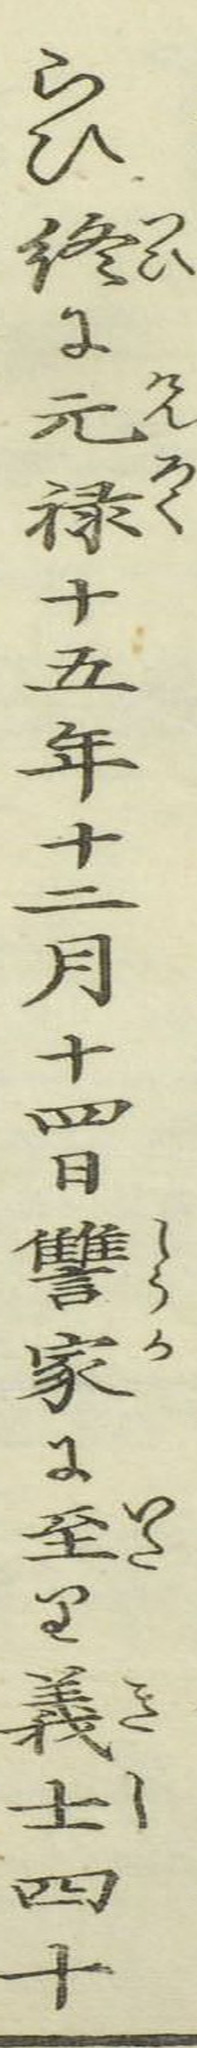らひ終に元禄十五年十二月十四日讐家に至り義士四十
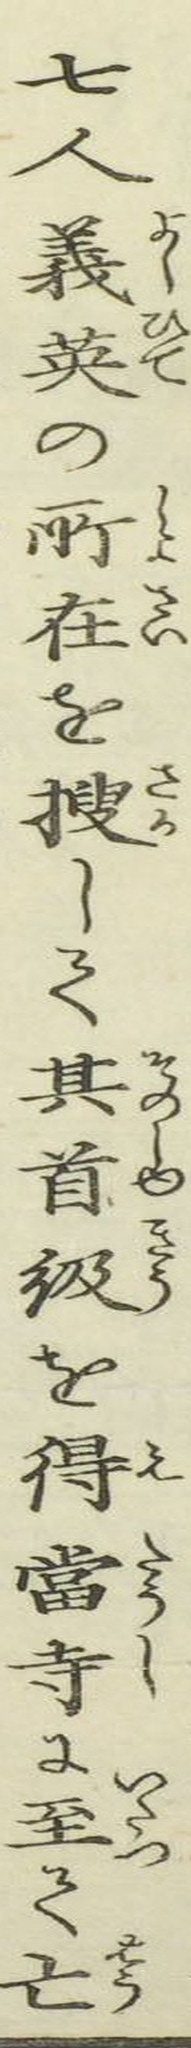七人義英の所在を捜して其首級を得當寺に至て亡
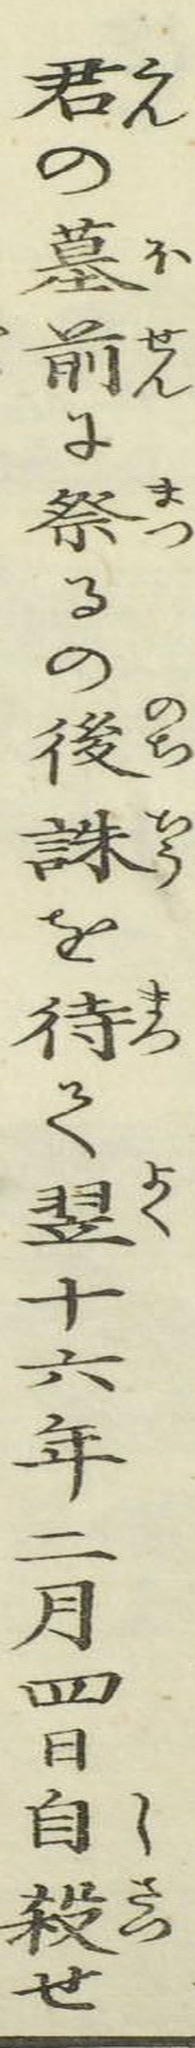君の墓前に祭るの後誅を待て翌十六年二月四日自殺せ
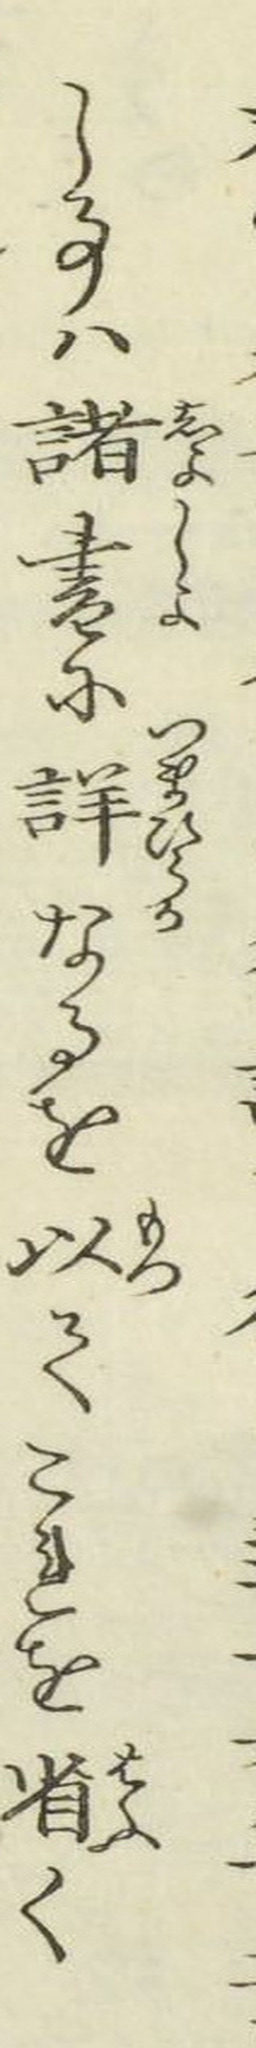し事は諸書に詳なるを以てこれを省く
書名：江戸名所図会 20巻 巻之3
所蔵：東京学芸大学教育コンテンツアーカイブ
